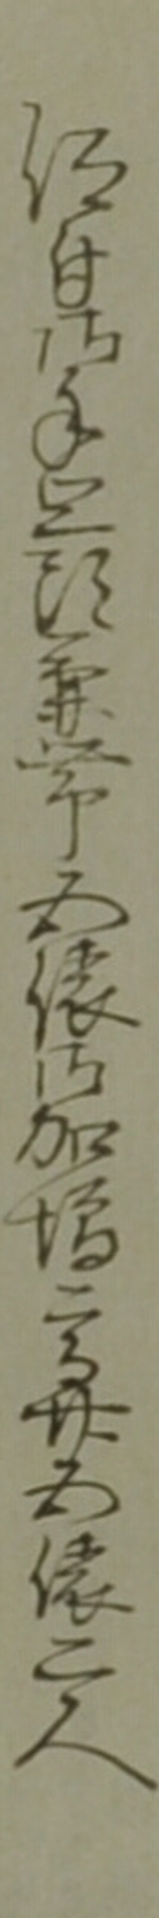仰付御手廻頭兼帯五俵御加増高廿五俵二人
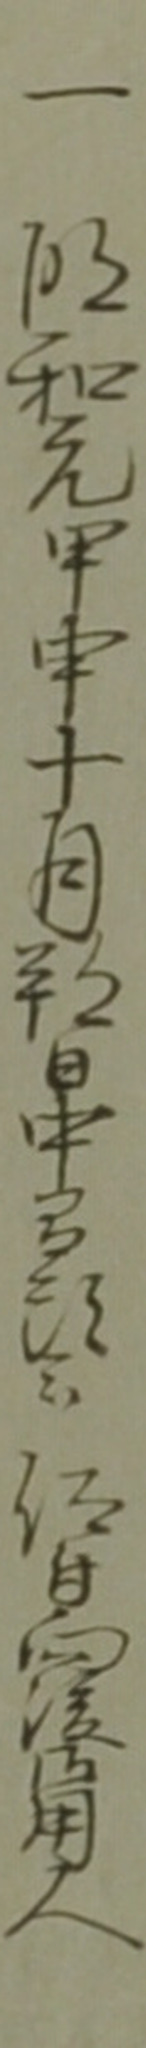一明和元甲申十月朔日中間頭被仰付向後御用人
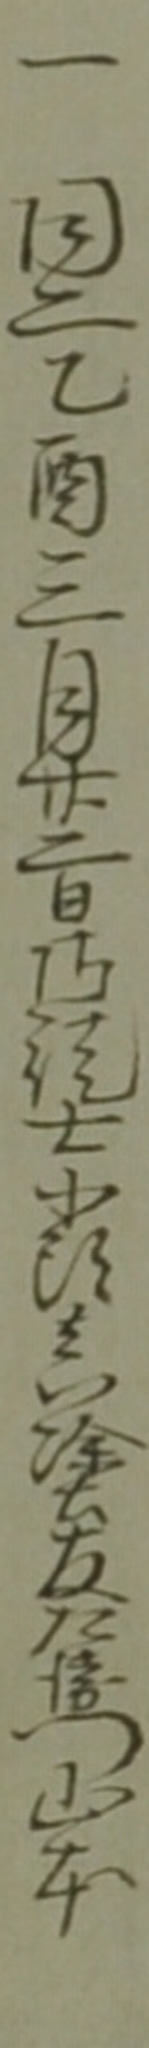一同二乙酉三月廿二日御徒士小頭真塗友左衛門山本
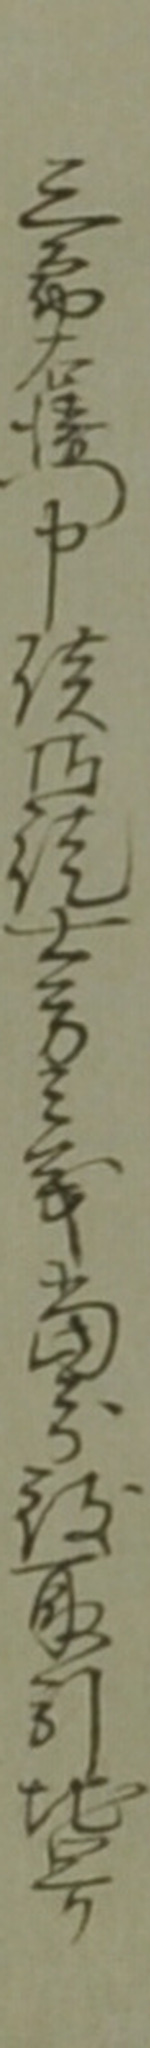三郎右衛門申談御徒士方之義当分致取引地廻
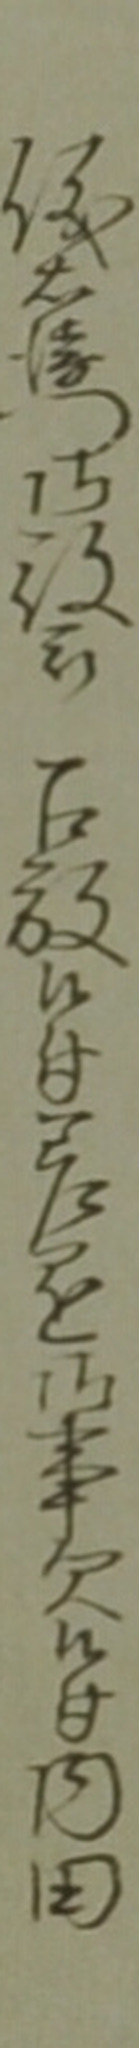儀右衛門御役被召放候付差懸御事欠候付内田
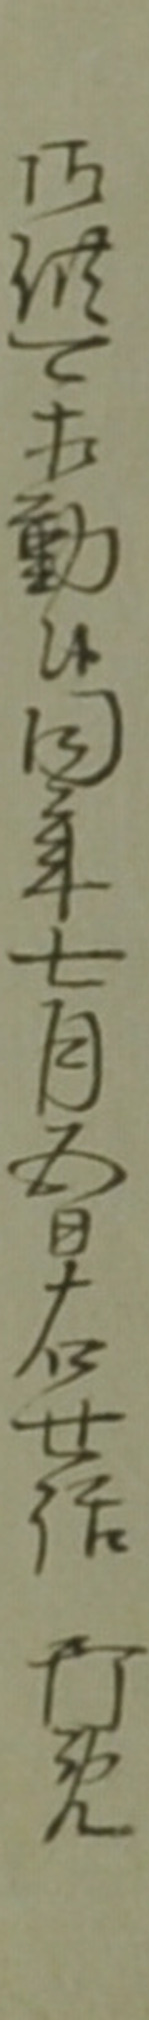御供可相勤候同年七月五日右世話御免
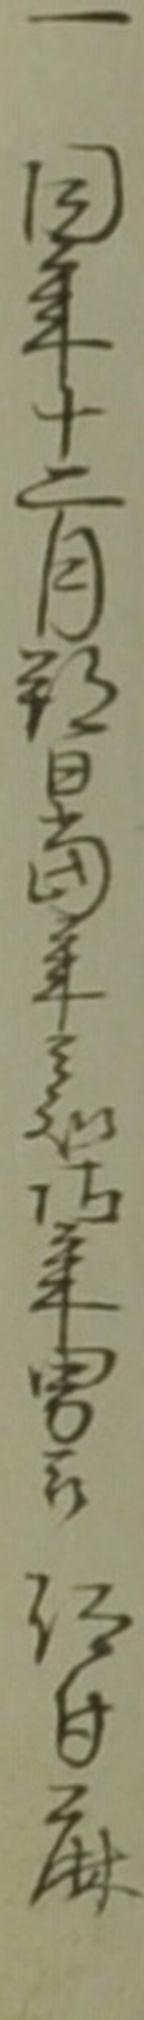一同年十二月朔日当年之処御年男被仰付麻
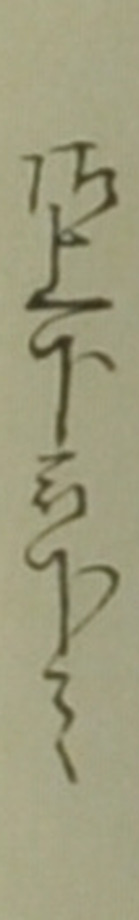御上下被下之

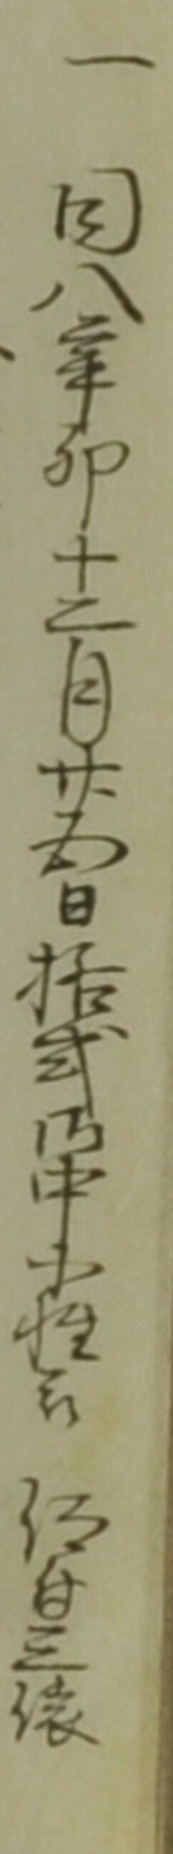一同八辛卯十二月廿五日格式御中小性被仰付三俵
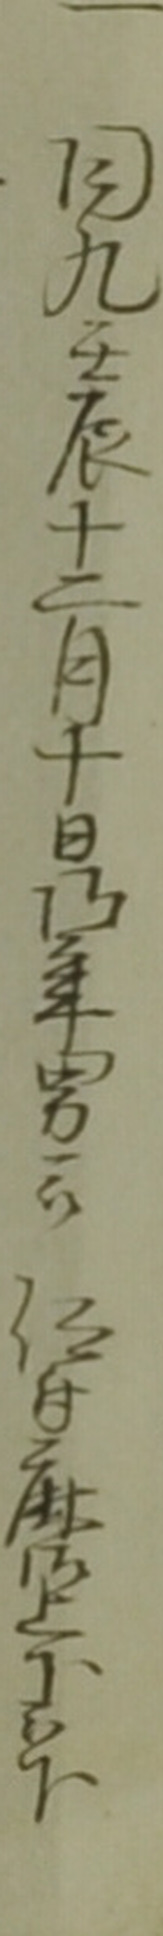一同九壬辰十二月十日御年男被仰付麻御上下被下
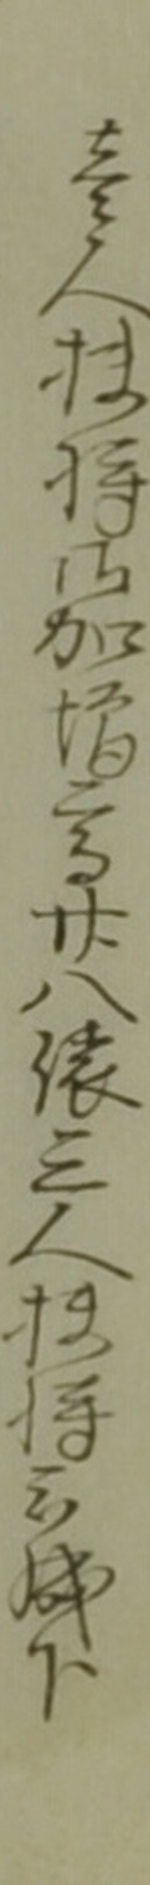壱人扶持御加増高廿八俵三人扶持被成下
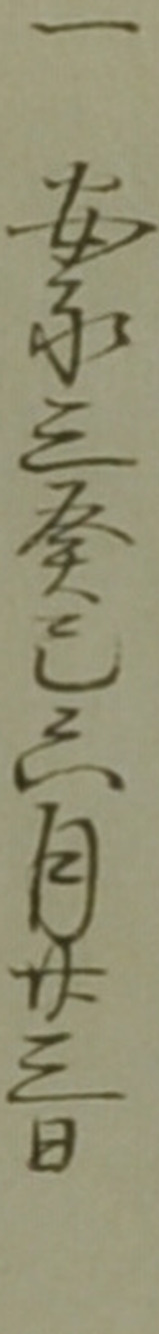一安永三癸巳六月廿三日
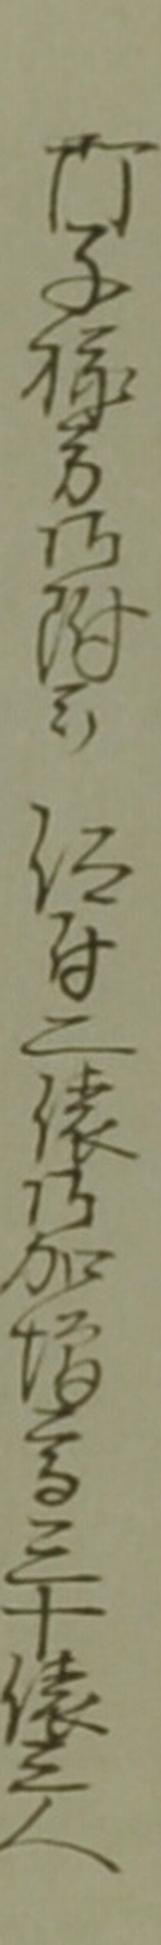御子様方御附被仰付二俵御加増高三十俵三人
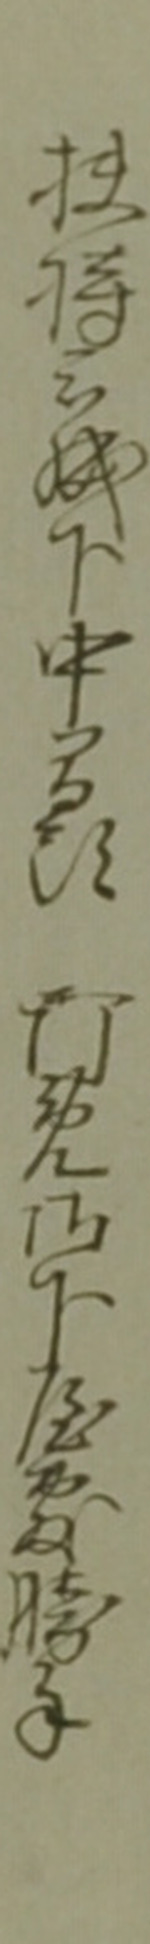扶持被成下中間頭御免御下屋敷勝手
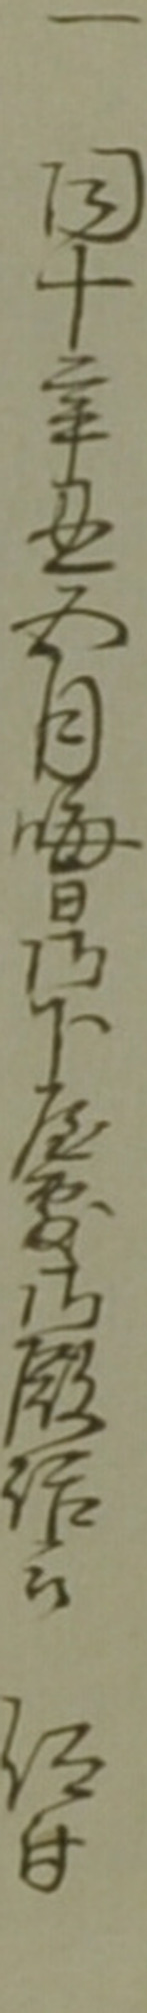一同十辛丑五月晦日御下屋敷御殿詰被仰付
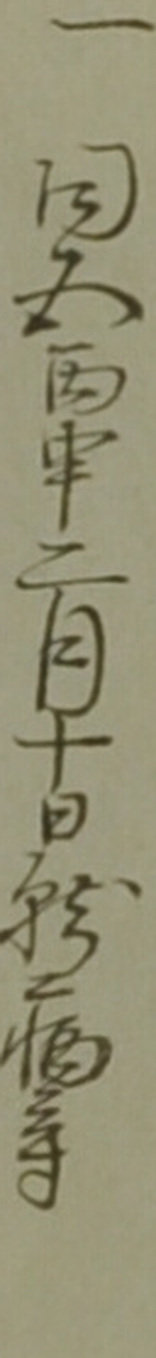一同五丙申二月十日就病気
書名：無足廃家（弐）
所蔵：伊那市立高遠町図書館・合同会社AMANE
